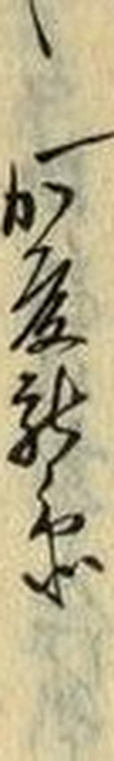加藤新兵衛
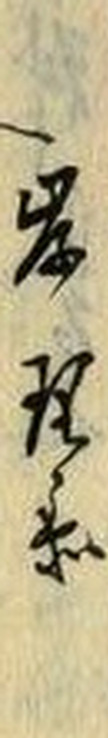岸理兵衛
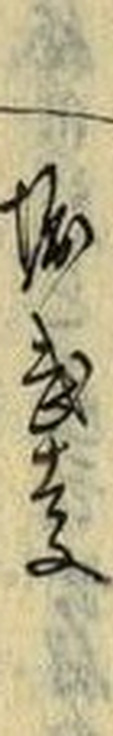堀武太夫
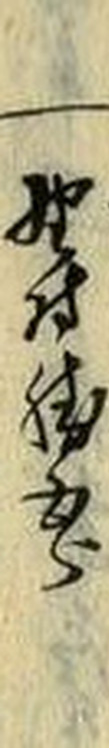野村勝五郎
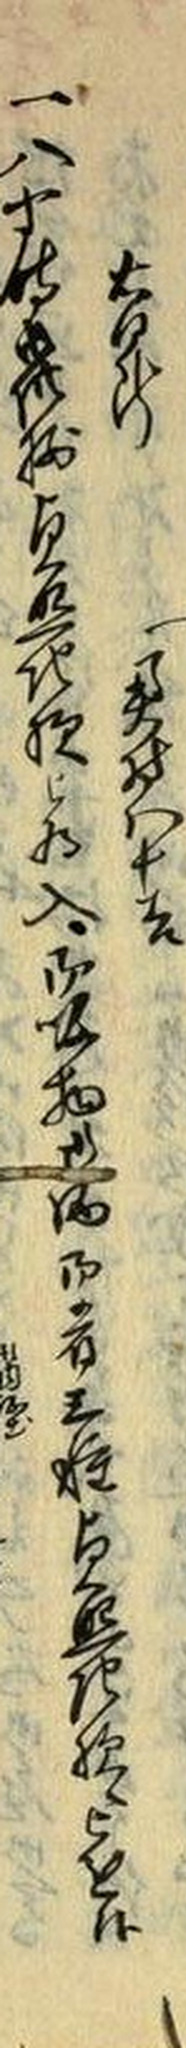一八半時御供揃貞照院様被為入御吸物御酒御肴三種貞照院様へ被進候
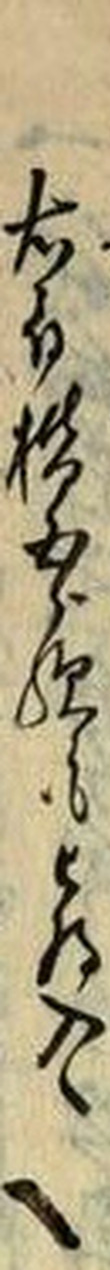右ニ付揩五郎様ニも被為入候
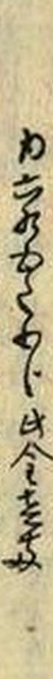内六拾五匁五分此金壱両
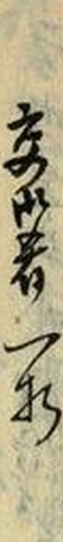交御肴一折
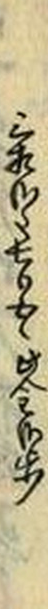三拾弐匁七分五厘此金弐歩
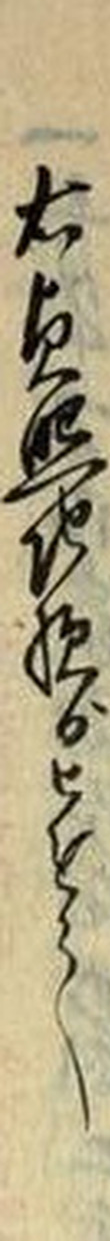右貞照院様ゟ被進之
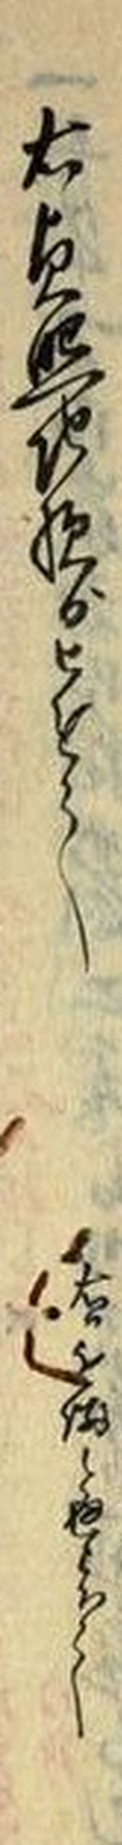右貞照院様ゟ被進之
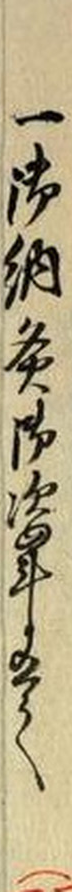一御納灸御姿斗有之
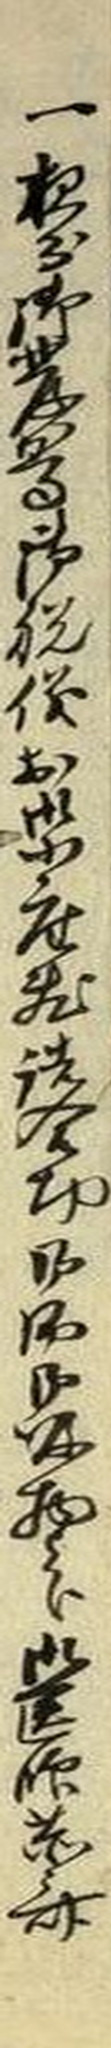一夜分御発駕御祝儀於御小座敷詰合切御酒御吸物被下御医師恭斎
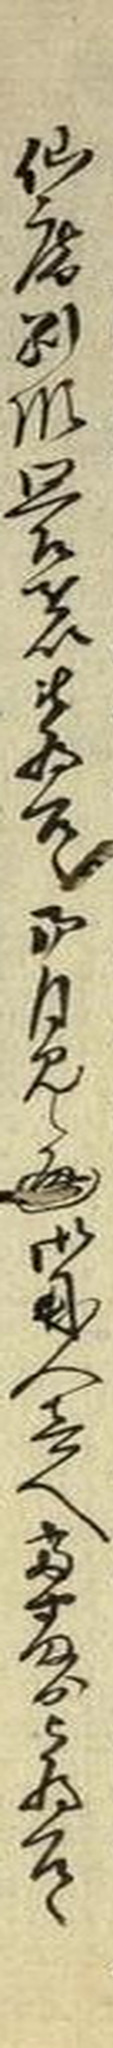仙庵別段思召を以被為召候御月見之通御用人壱人当番ゟ被為召候
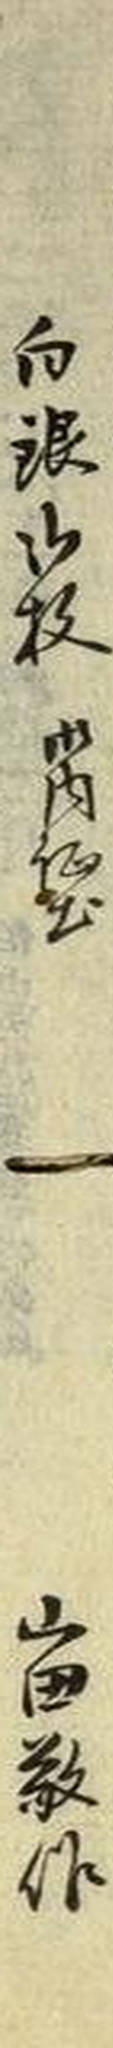白銀弐枚御内証出山田敬作
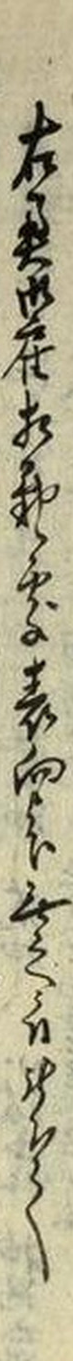右奥御雇相勤候処表向被下無之ニ付被下之
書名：少傅日録抄（斉承付側向頭取日記、在国）
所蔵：福井県文書館 Fukui Prefectural Archives
